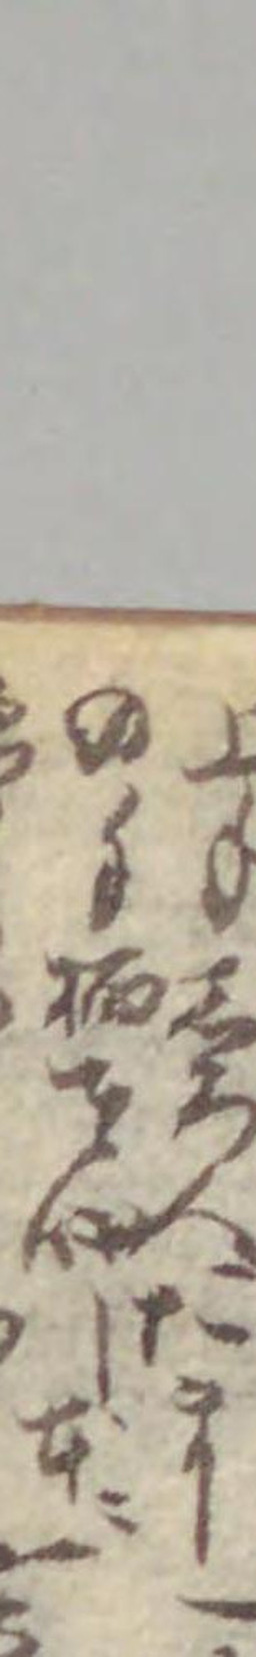の手柄を咄し本二
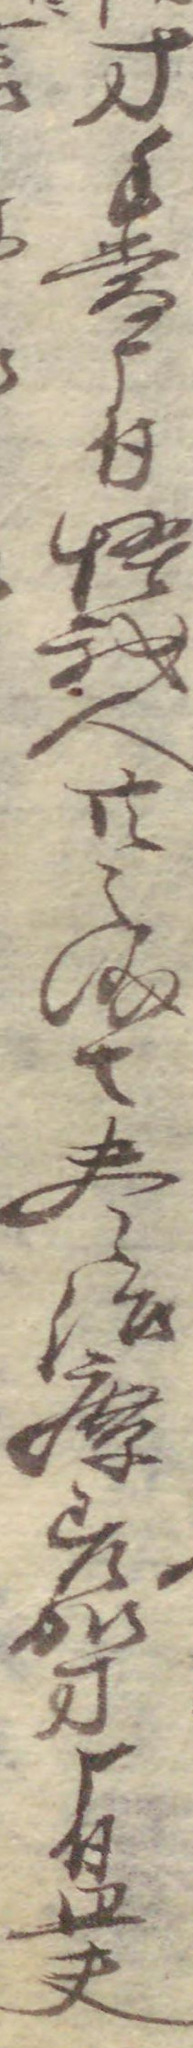方手当申付怪我人共之儀者夫〻治療差加方申付且夫
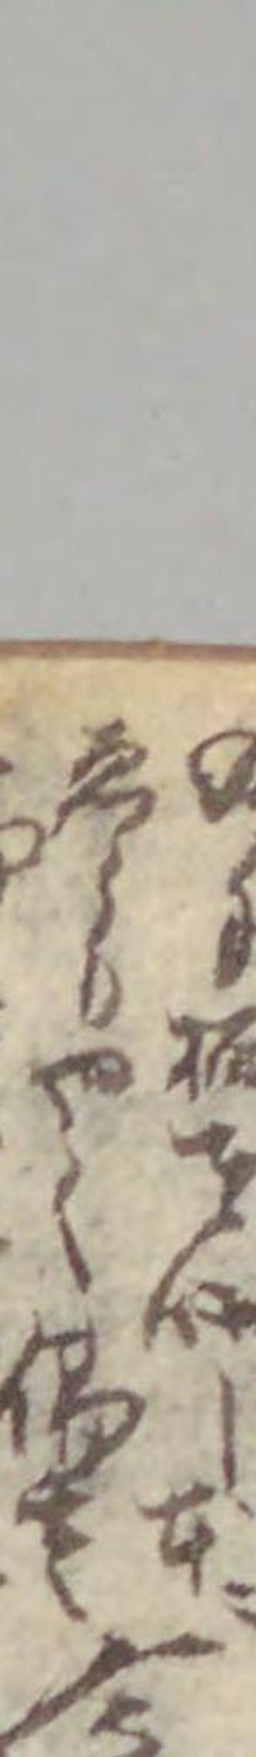ゑうりやく傷寒
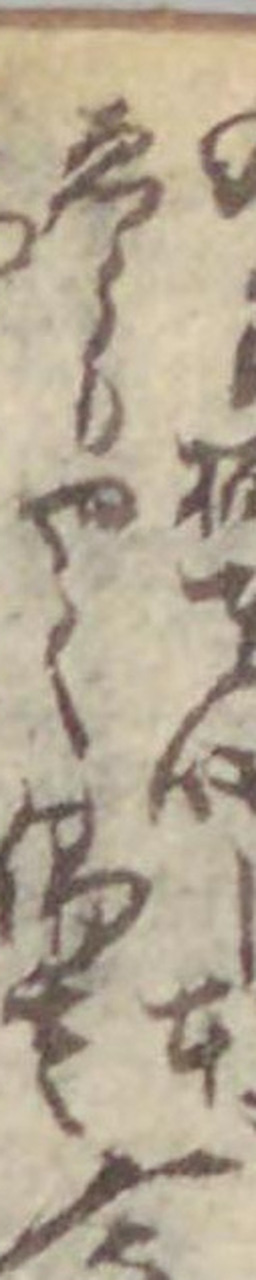ゑうりやく傷寒
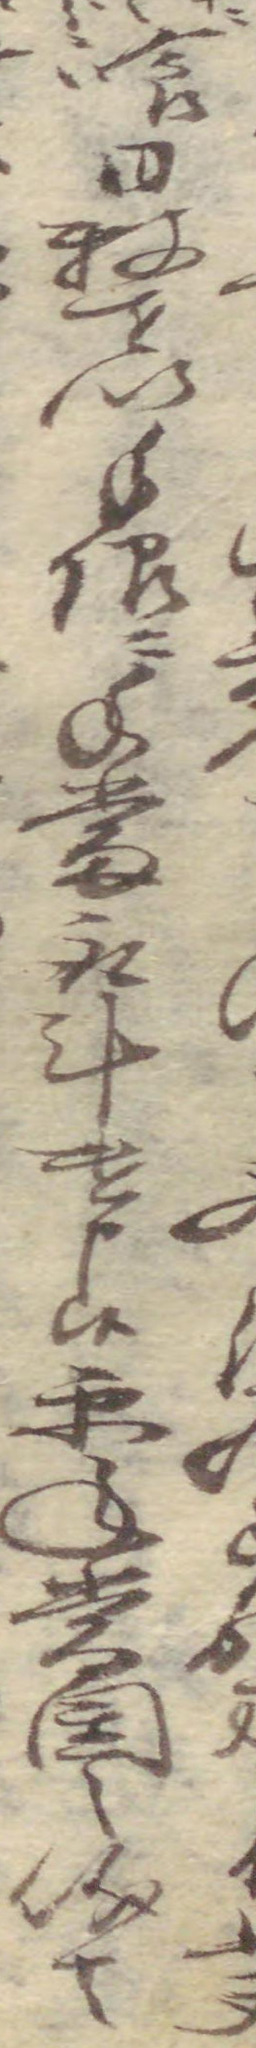喰日数を以手限ニ手当取計遣申候平年当国之儀は
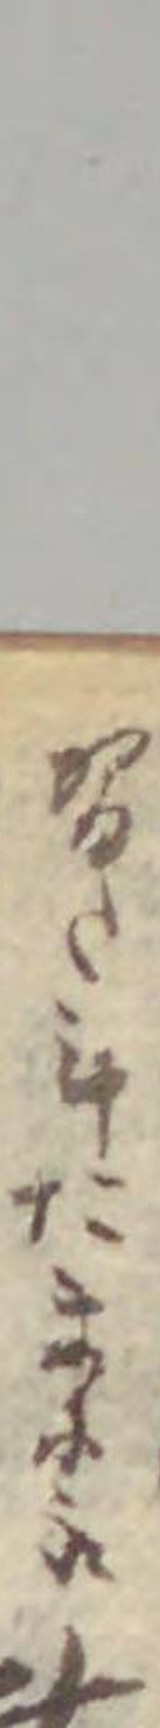習た斗たまに取
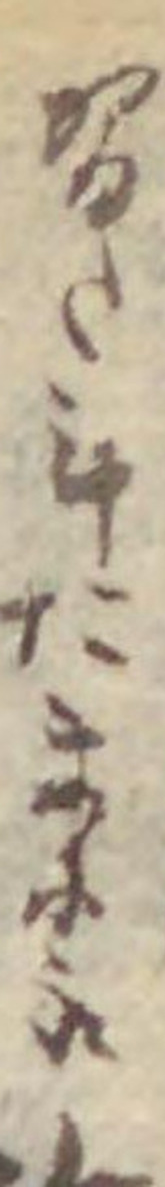習た斗たまに取
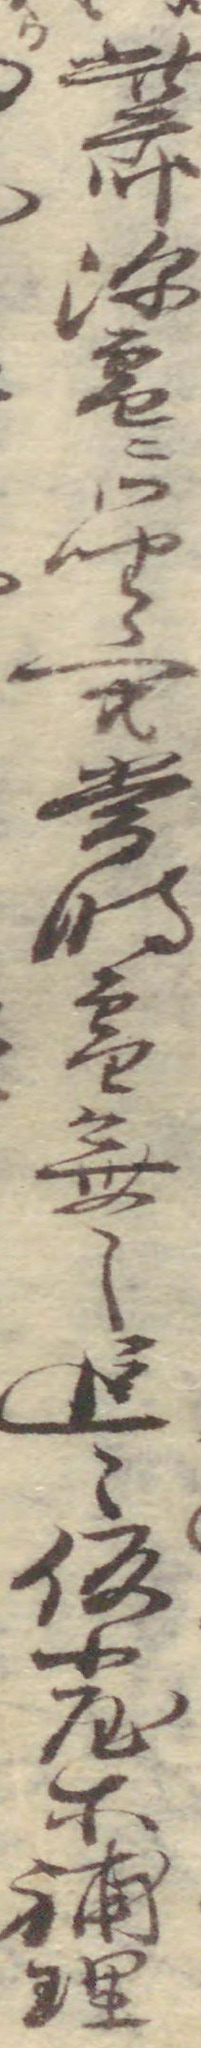此節深雪ニ御座候へ共当時雪無之追〻仮小屋等補理
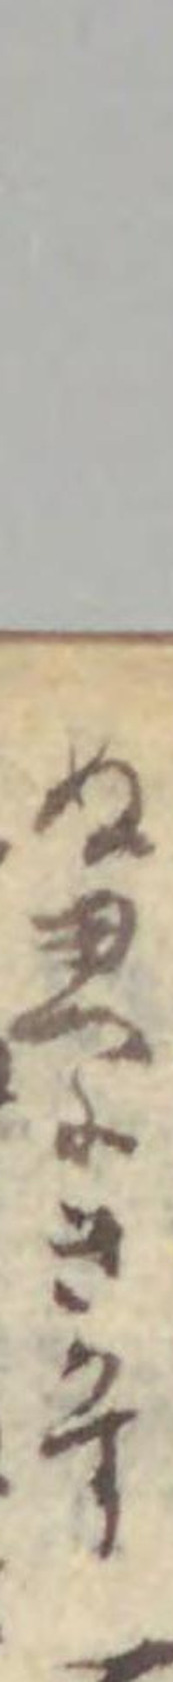ぬゆへにきかす
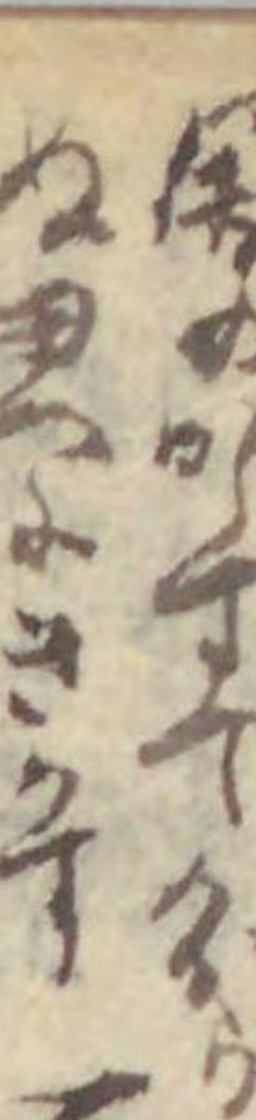ぬゆへにきかす
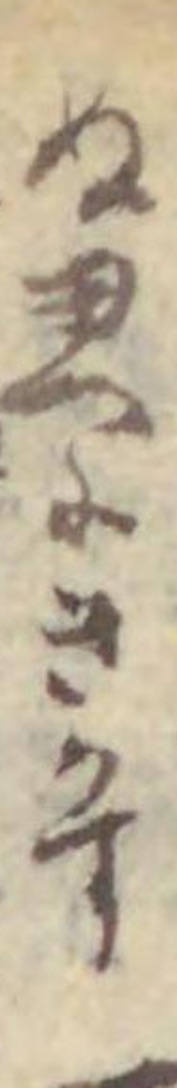ぬゆへにきかす
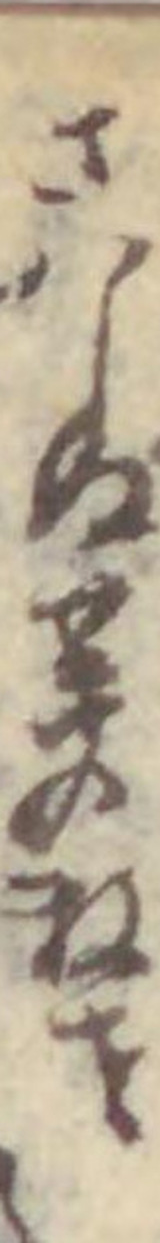さハらぬ薬の数を
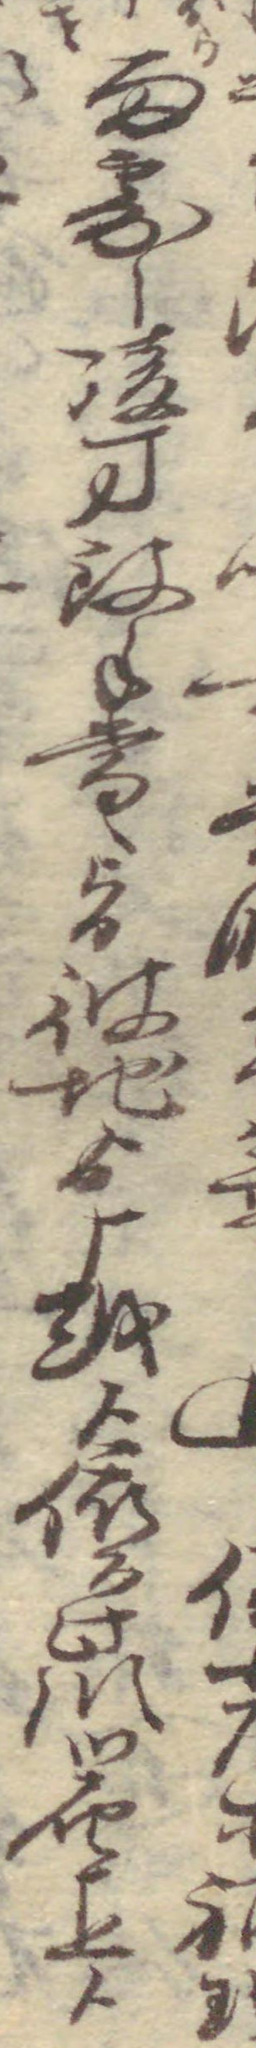雨露之凌方致手当候旨彼地ゟ申越候依て此段御届申上候
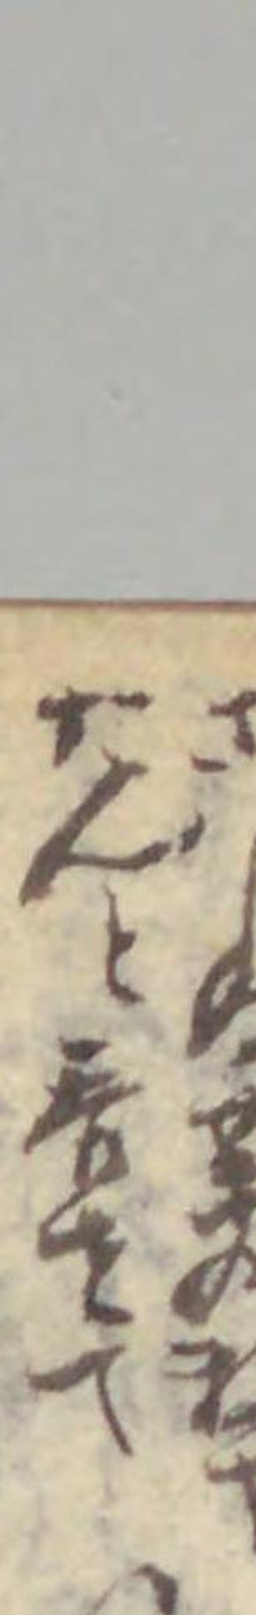たんと呑せて
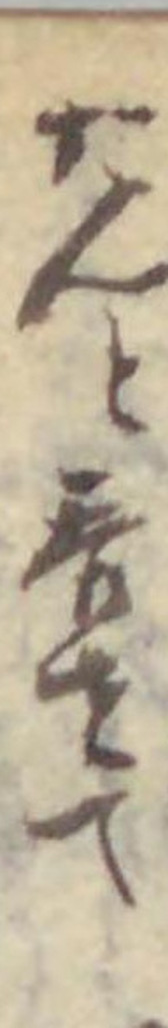たんと呑せて
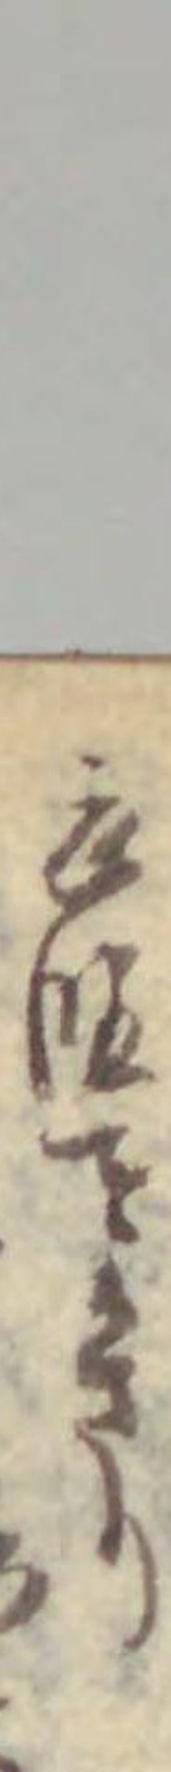衣服をかさり
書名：鶯宿雑記. 巻199-200
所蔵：国立国会図書館 National Diet Library, JAPAN
